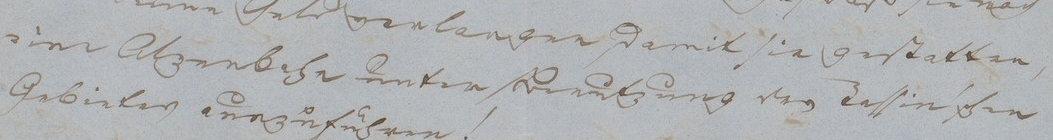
eine Alpenbahn unter Benutzung des Tessin'schen
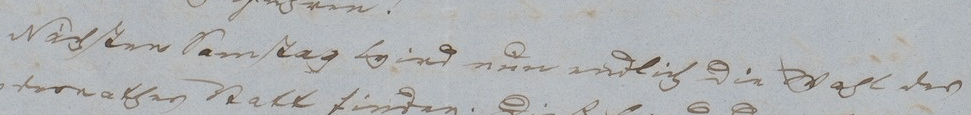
Nächsten Samstag wird nun endlich die Wahl des
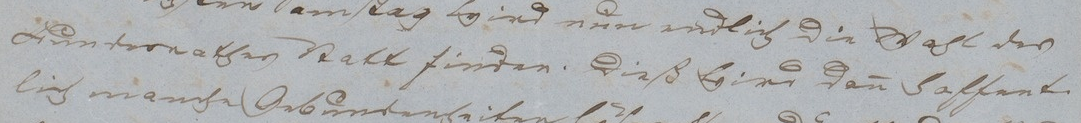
Bundesrathes Statt finden. Dieß wird dann hoffent-
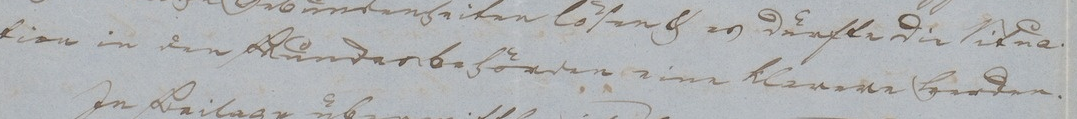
tion in den Bundesbehörden eine klarere werden.
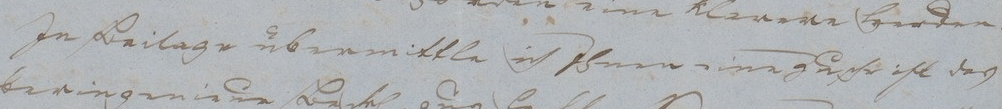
In Beilage übermittle ich Ihnen eine Zuschrift des
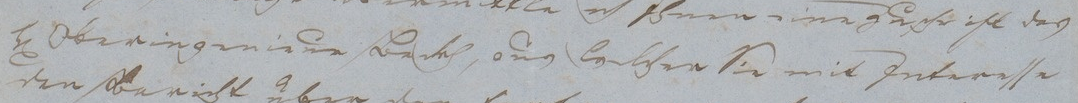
Hrn Oberingenieur Beckh, aus welcher Sie mit Interesse
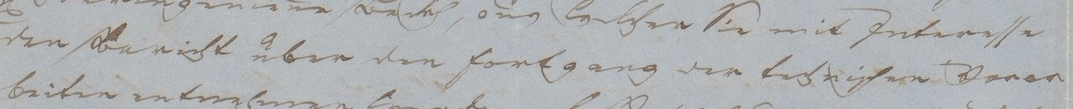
den Bericht über den Fortgang der technischen Vorar-
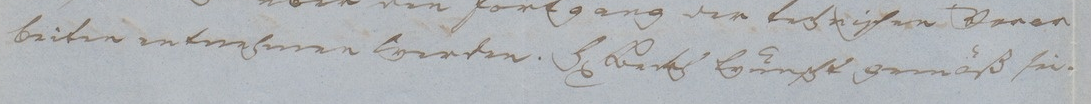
beiten entnehmen werden. Hr Beckh wünscht gemäß sei-
